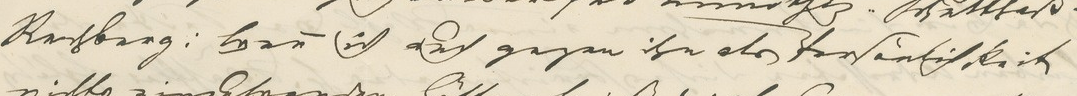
Rechberg: wenn ich auch gegen ihn als Persönlichkeit
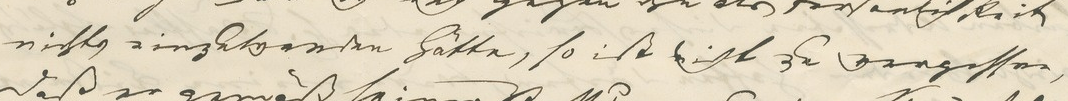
nichts einzuwenden hätte, so ist nicht zu vergessen,
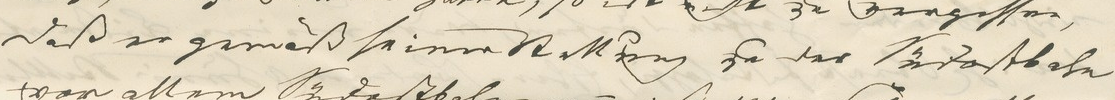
daß er gemäß seiner Stellung zu der Südostbahn
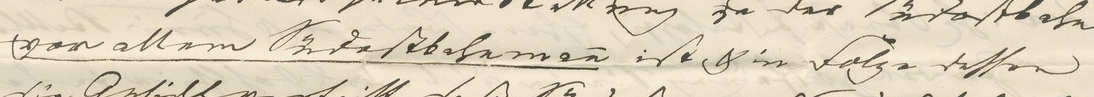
vor allem Südostbahnmann ist & in Folge dessen
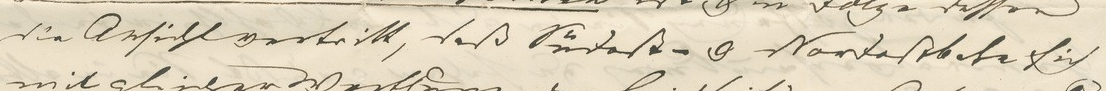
die Ansicht vertritt, daß Südost- & Nordostbahn sich
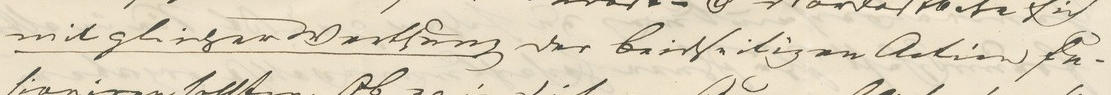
mit gleicher Werthung der beidseitigen Actien fu-
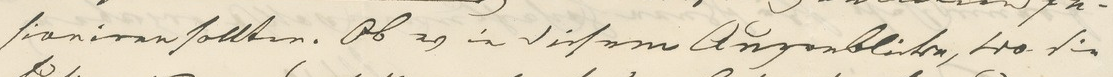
sionieren sollten. Ob es in diesem Augenblicke, wo die
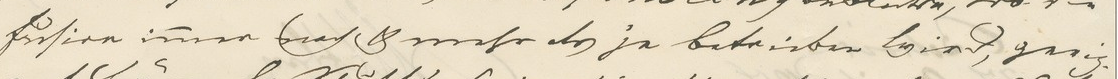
Fusion immer noch & mehr als je betrieben wird, geeig-
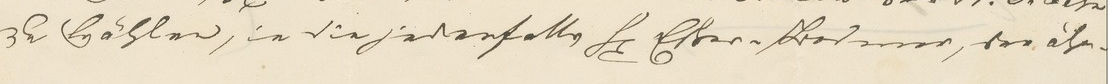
zu wählen, in die jedenfalls Herr Escher-Bodmer, der ähn-
